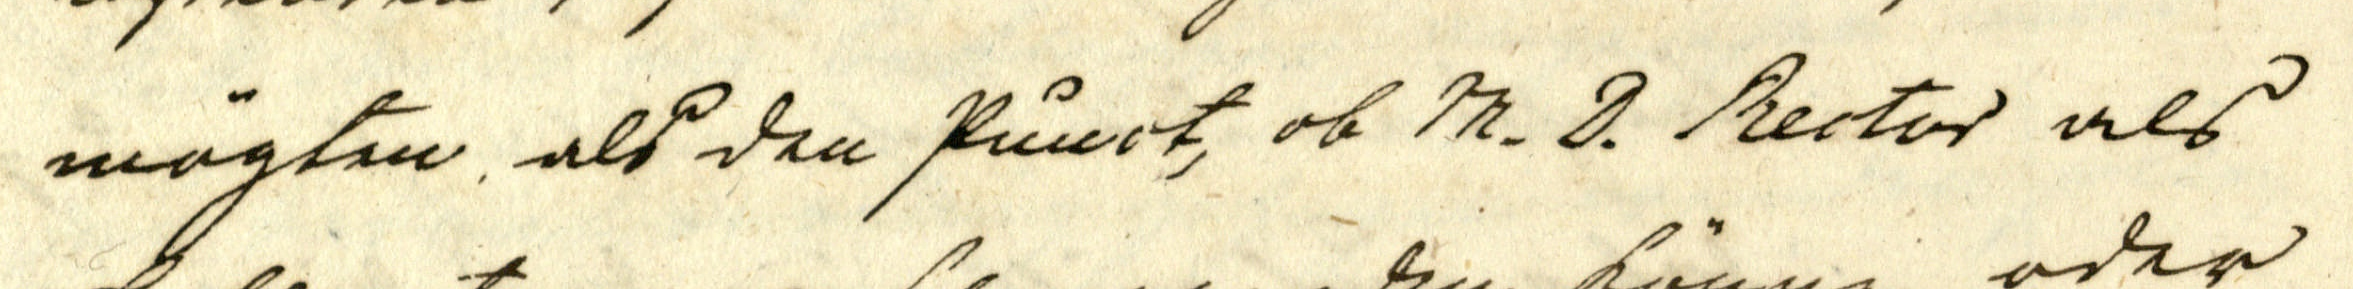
mögten, als den Punct, ob M. D. Rector als
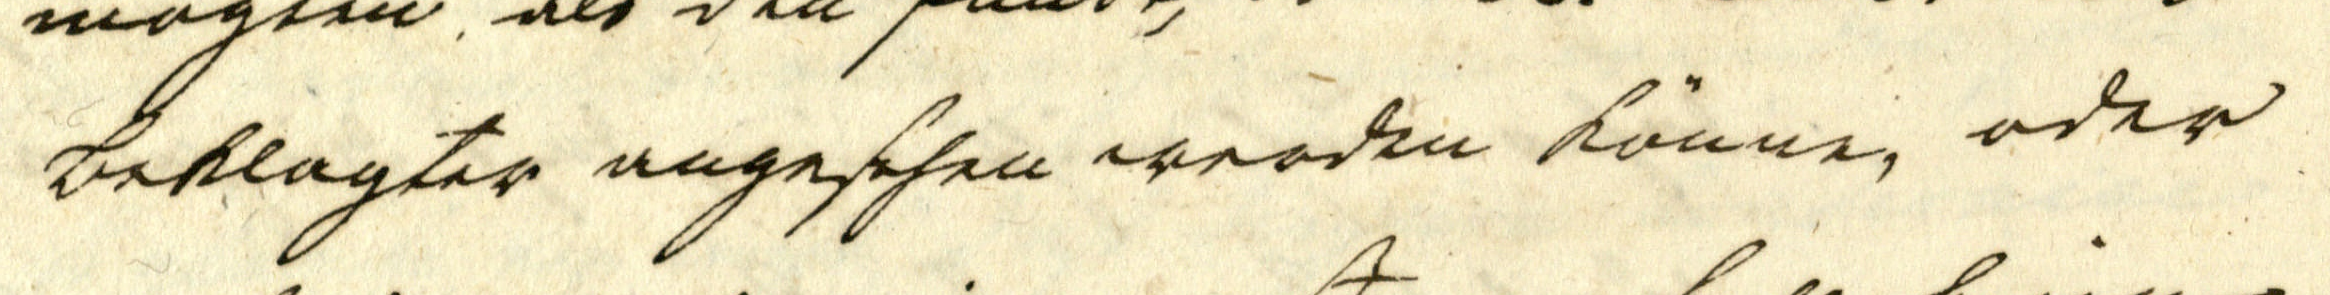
Beklagter angesehen werden könne, oder
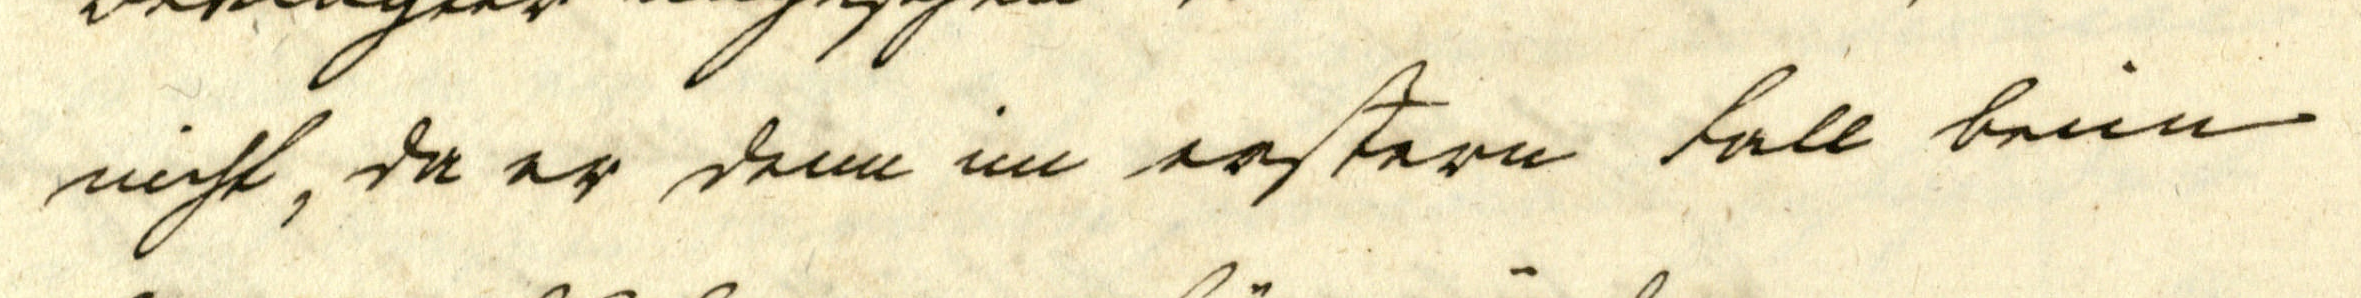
nicht, da er denn im erstern Fall beim
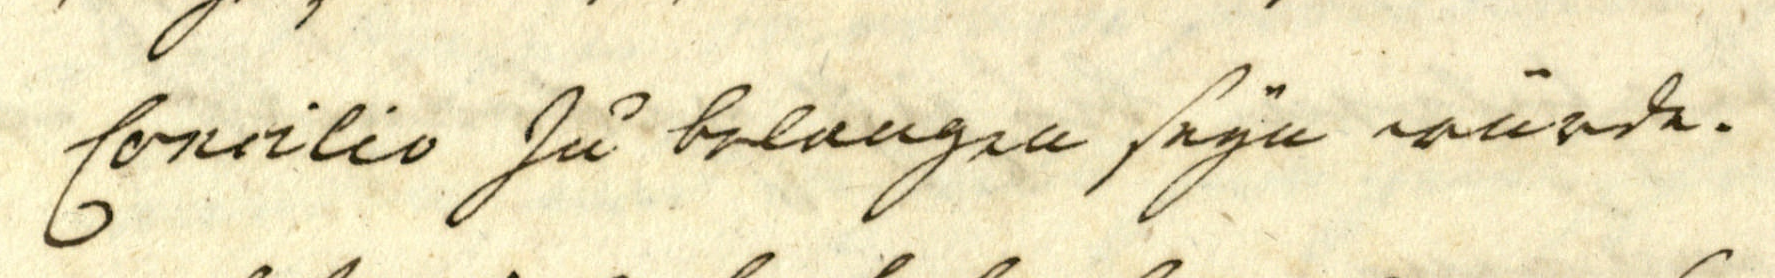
Concilio zu belangen seÿn würde.
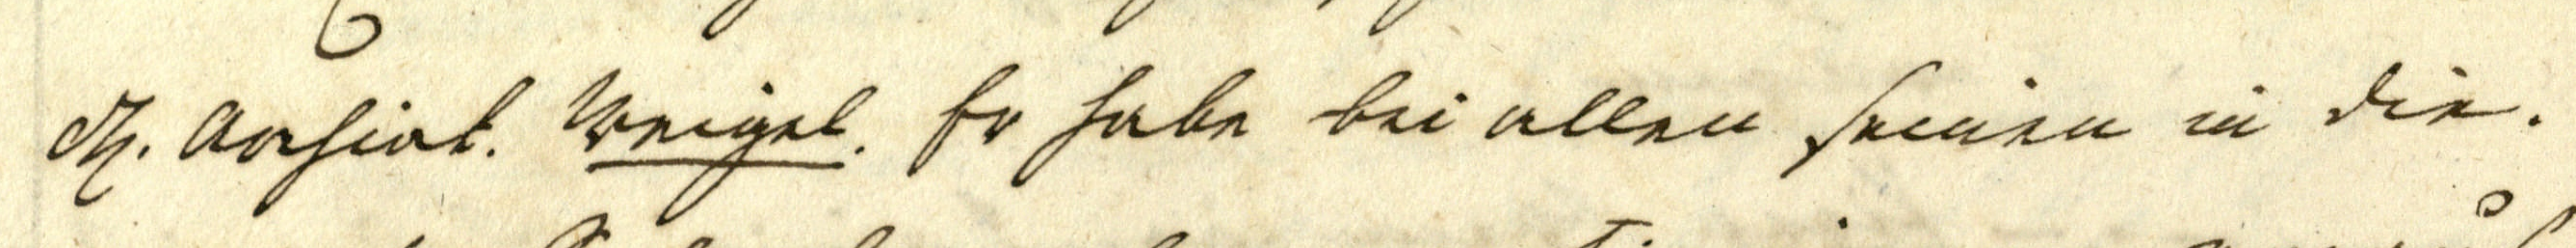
dh. Archiat. Weigel. Er habe bei allen seinen in die¬
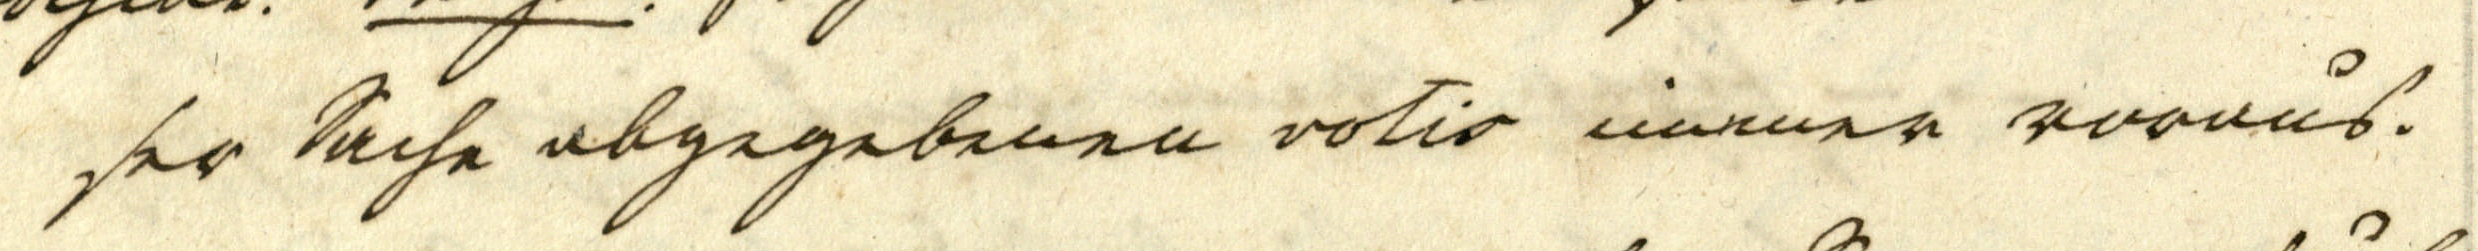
ser Sache abgegebenen votis immer voraus¬
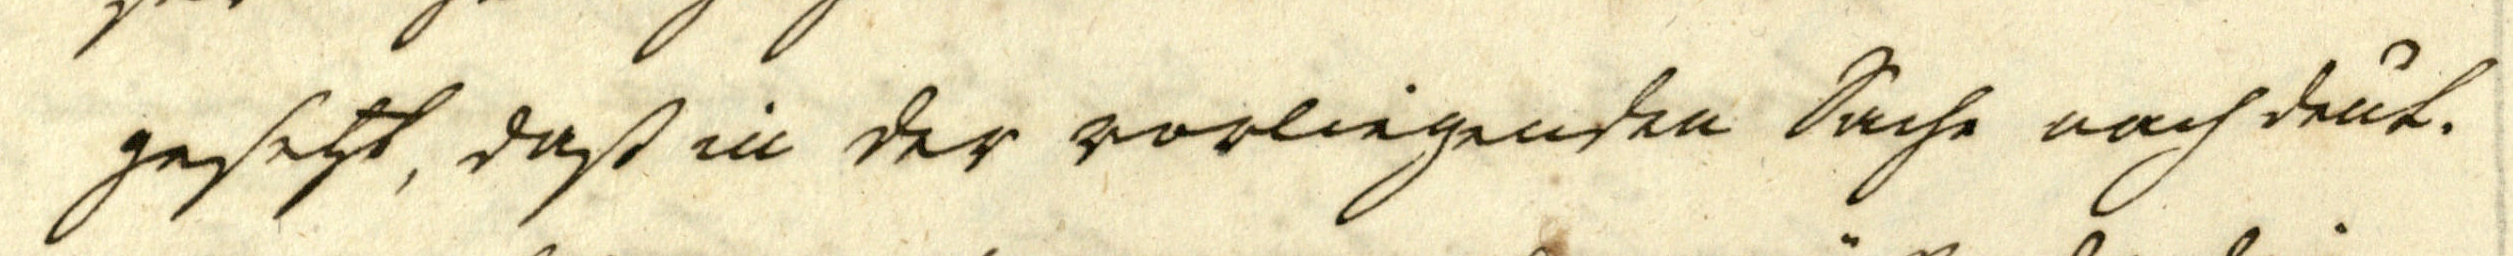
gesetzt, daß in der vorliegenden Sache nach deut¬
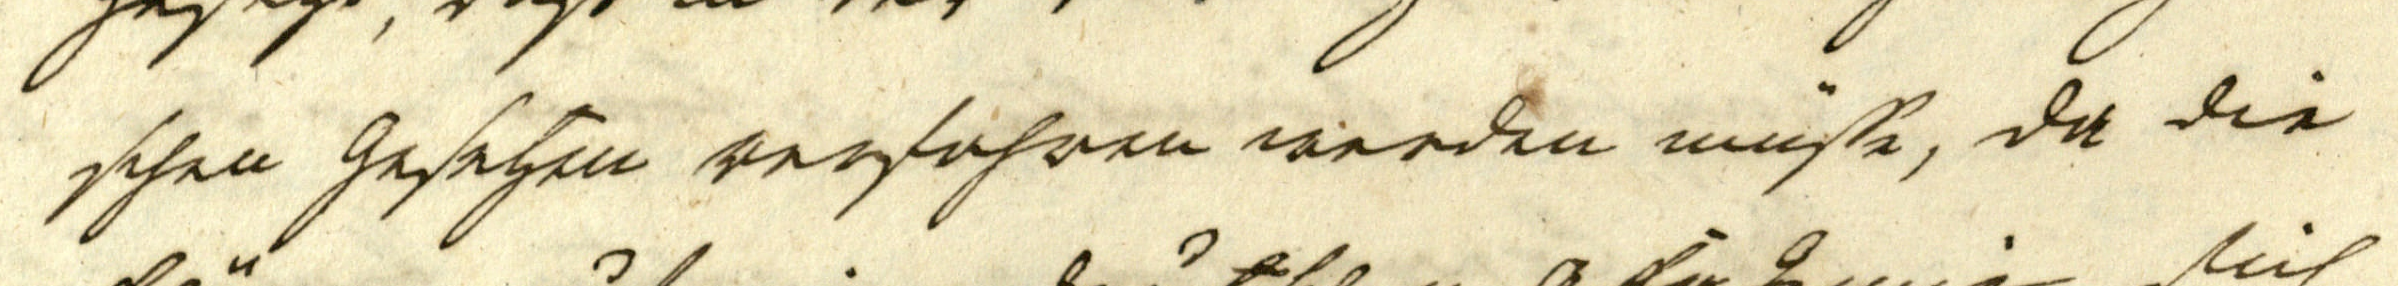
schen Gesetzen verfahren werden müsse, da die
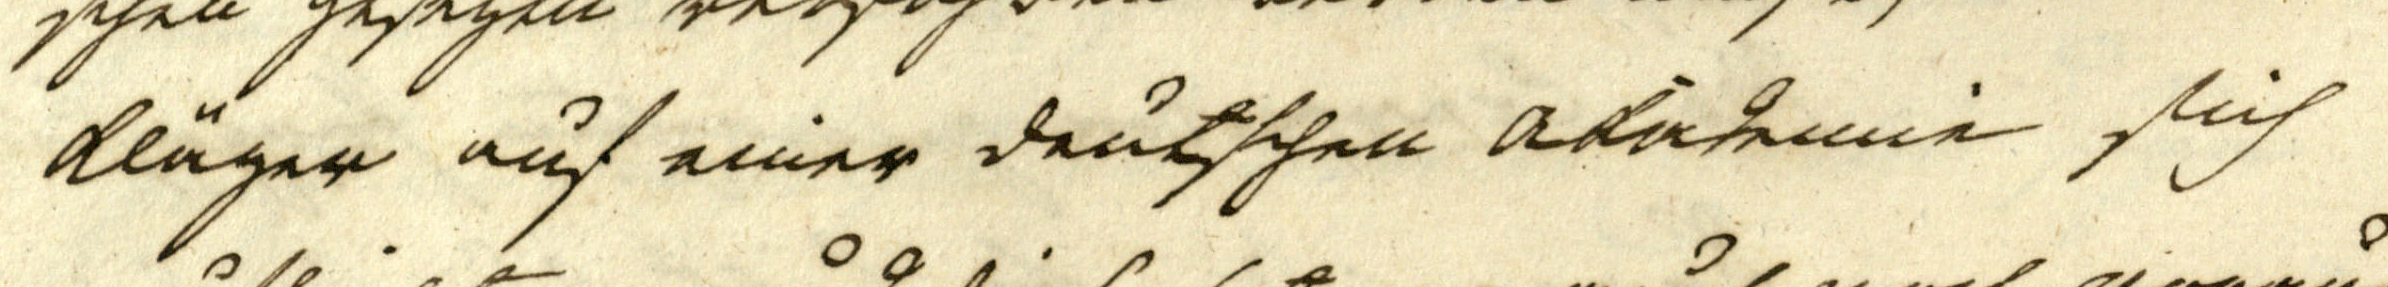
Kläger auf einer deutschen Akademie sich
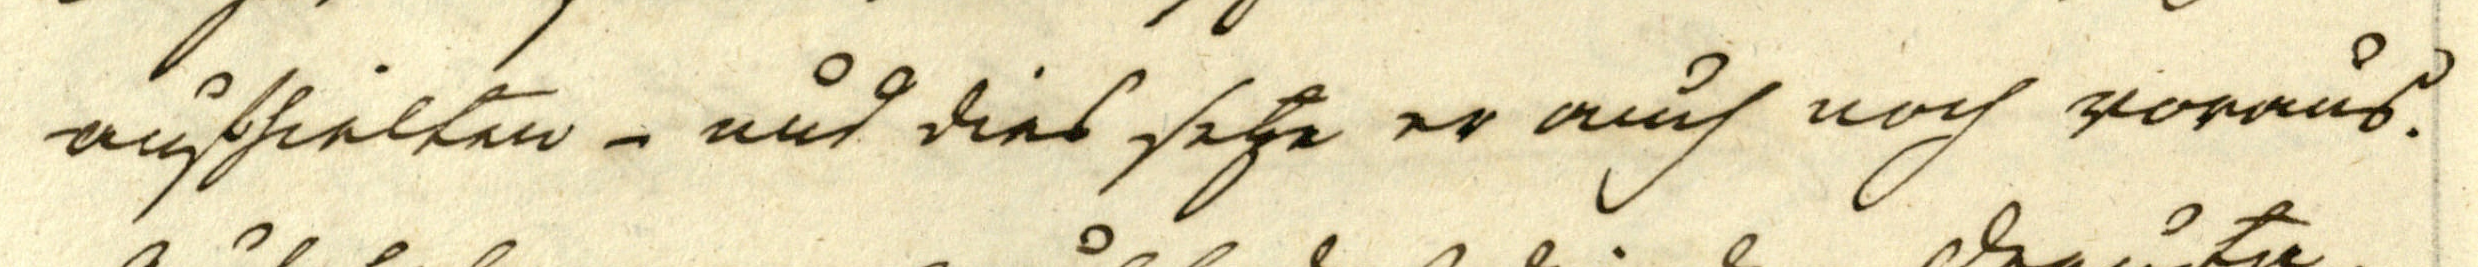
aufhielten und dies setze er auch noch voraus.
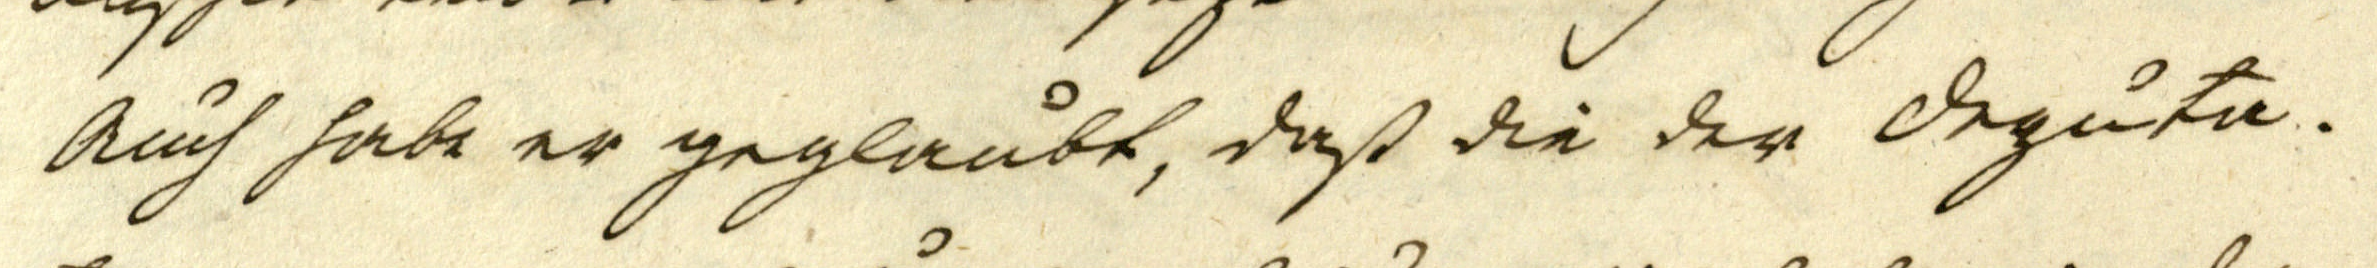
Auch habe er geglaubt, daß die der Deputa¬
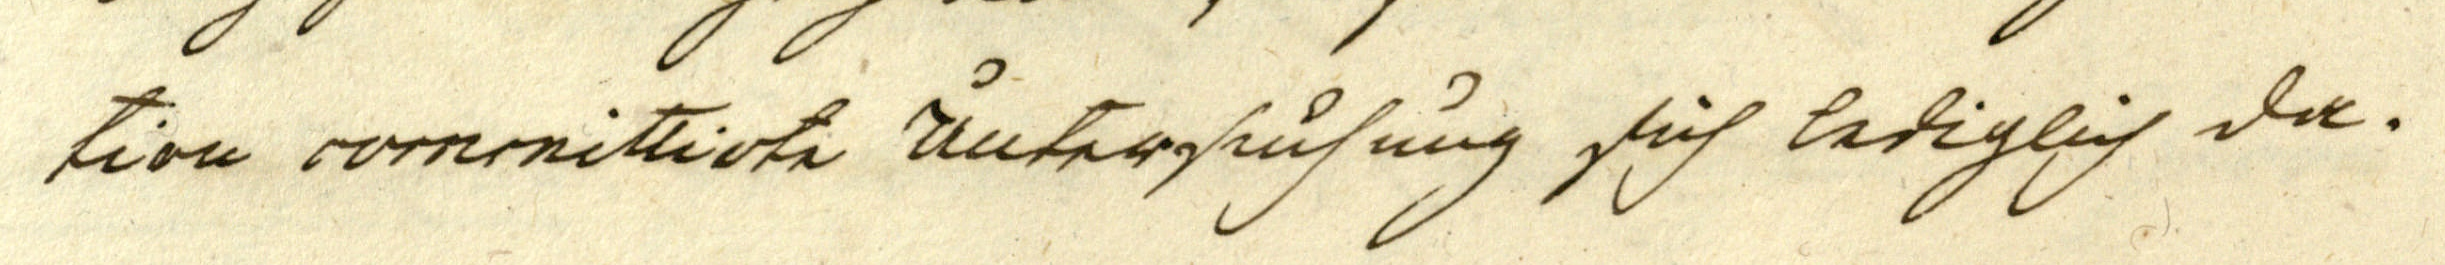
tion committirte Untersuchung sich lediglich da¬
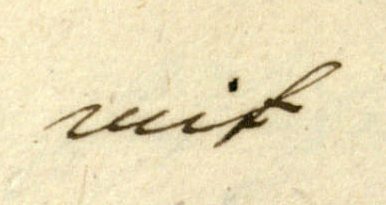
mit
